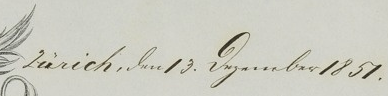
Zürich, den 13. Dezember 1851.
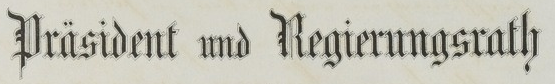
Präsident und Regierungsrath
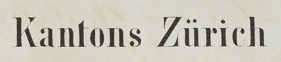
Kantons Zürich
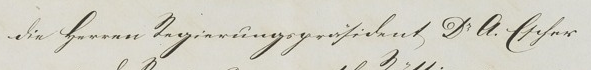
die Herren Regierungspräsident Dr A. Escher
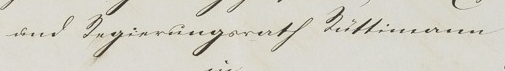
und Regierungsrath Rüttimann
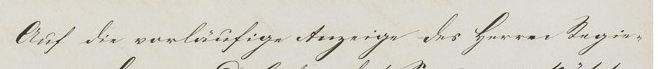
Auf die vorläufige Anzeige des Herrn Regie-
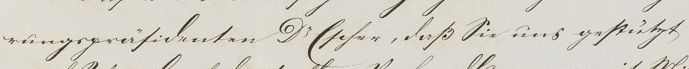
rungspräsidenten Dr Escher, daß Sie uns gestützt
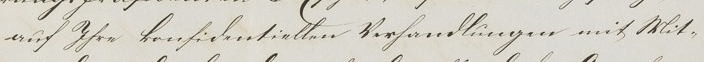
auf Ihre konfidentiellen Verhandlungen mit Mit-
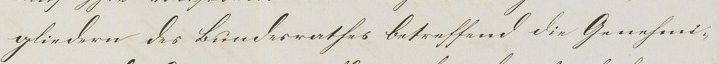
gliedern des Bundesrathes betreffend die Genehmi-
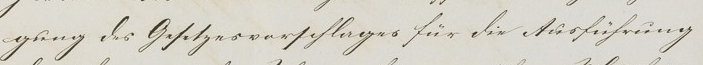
gung des Gesetzesvorschlages für die Ausführung
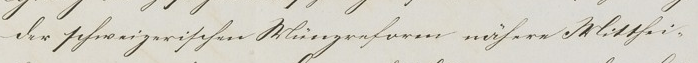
der schweizerischen Münzreform nähere Mitthei-
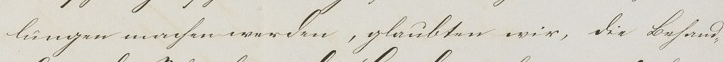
lungen machen werden, glaubten wir, die Behan-
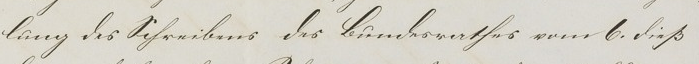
lung des Schreibens des Bundesrathes vom 6. dieß
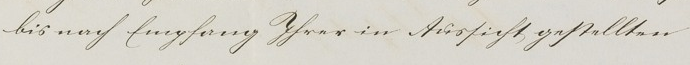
bis nach Empfang Ihrer in Aussicht gestellten
